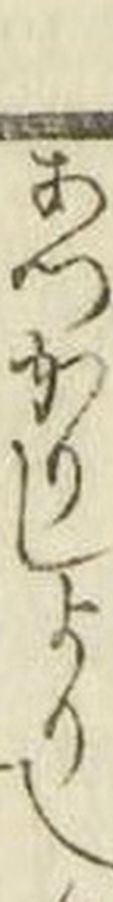あつかりしより
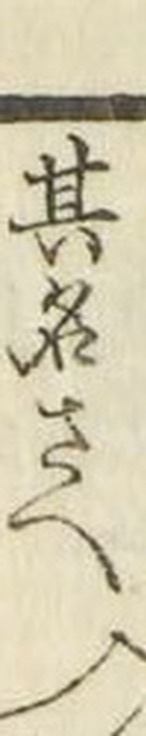其名さへ
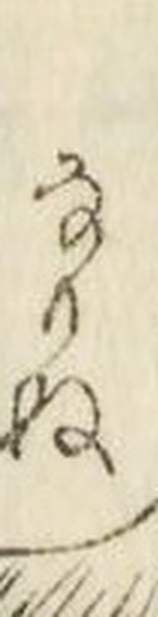なりぬ

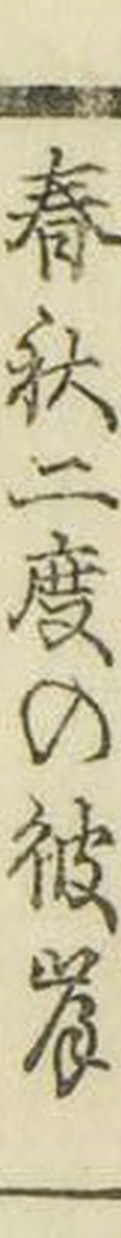春秋二度の彼岸
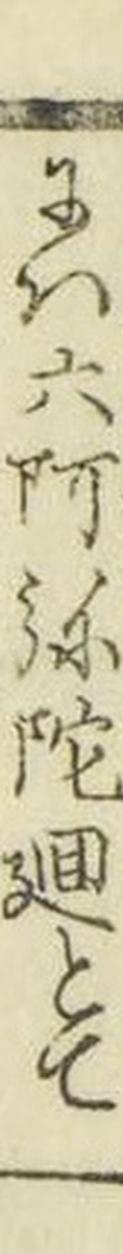には六阿弥陀廻とて
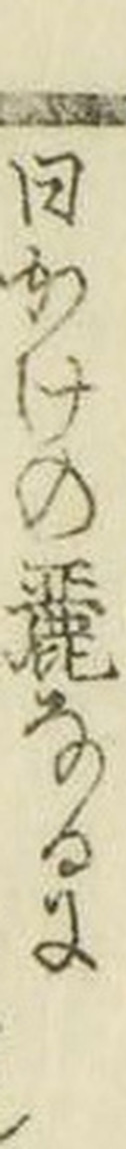日かけの麗なるに
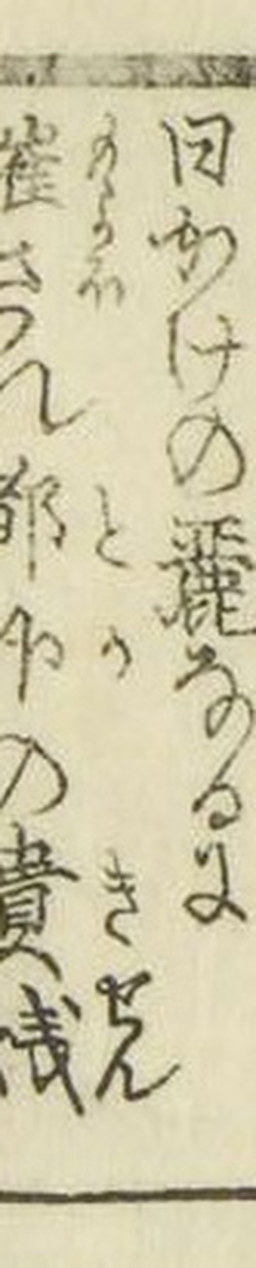催され都下の貴賤
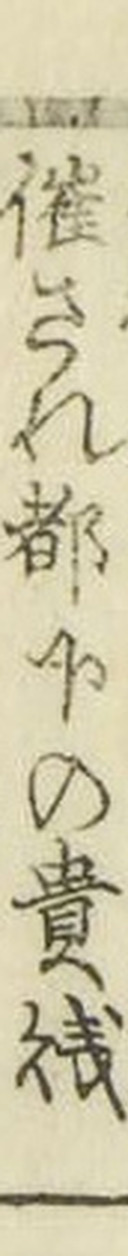催され都下の貴賤
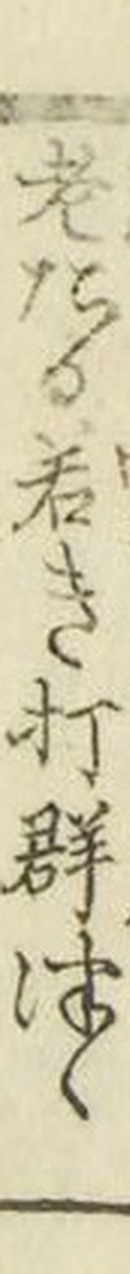老たる若き打群つゝ
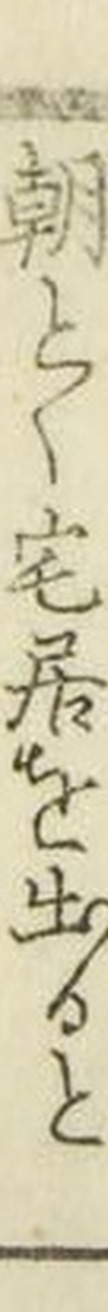朝とく宅居を出ると
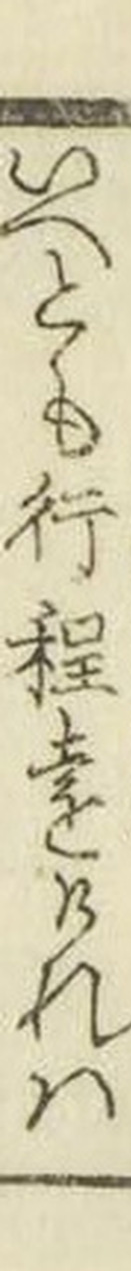いへとも行程遠けれは
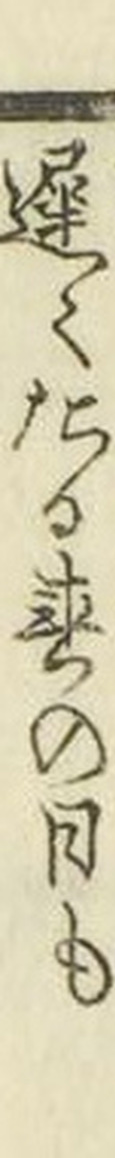遅々たる春の日も
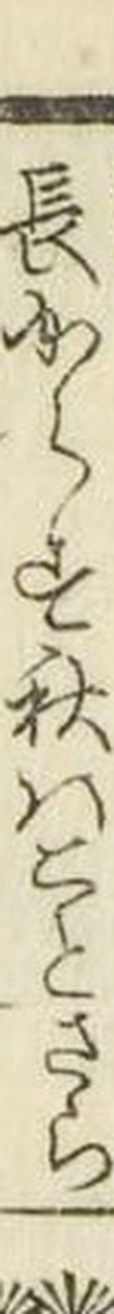長からす秋はことさら
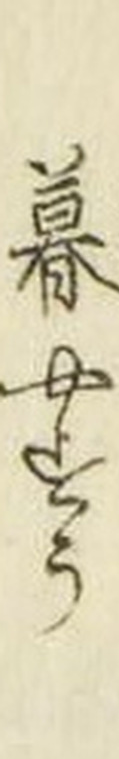暮やすう
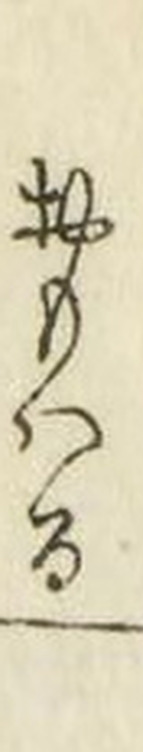おもはる

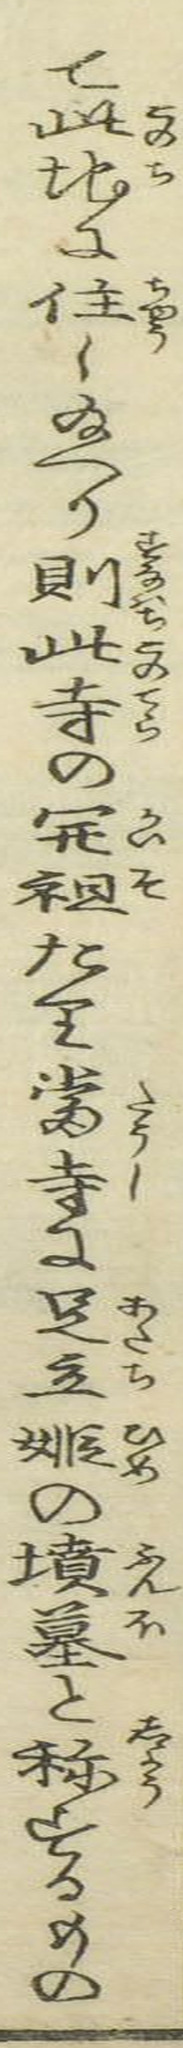て此地に住し給へり則此寺の開祖たり当寺に足立姫の墳墓と称するもの
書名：江戸名所図会 20巻 巻之17
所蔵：東京学芸大学教育コンテンツアーカイブ
